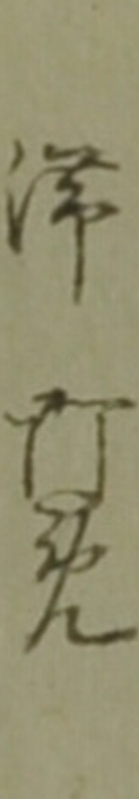帯御免
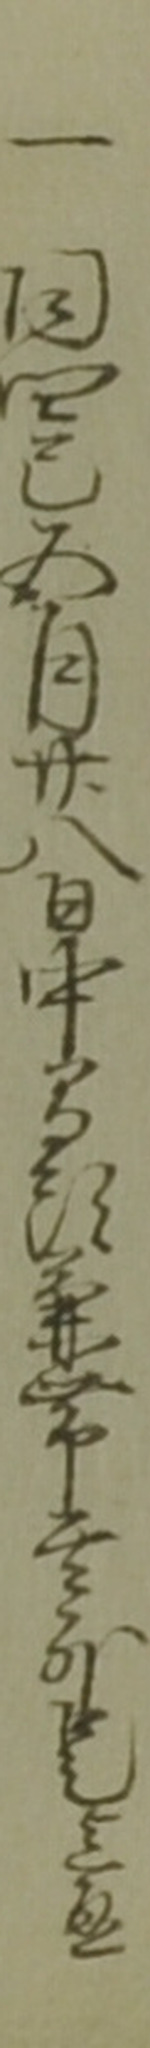一同四巳五月廿八日中間頭兼帯其外是迄通
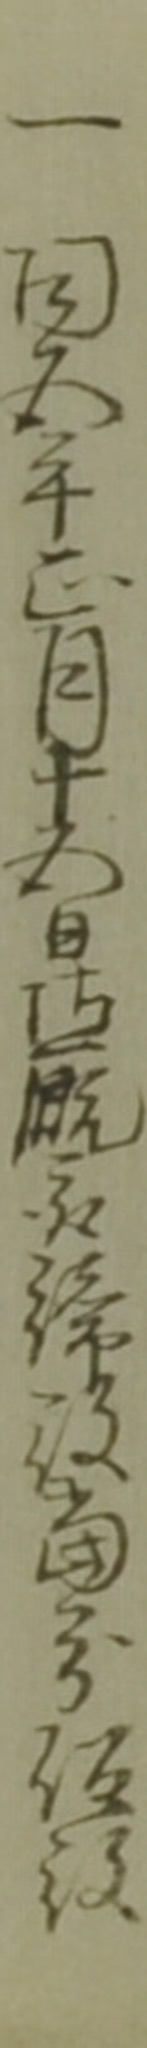一同五午正月十五日御厩取締役当分仮役
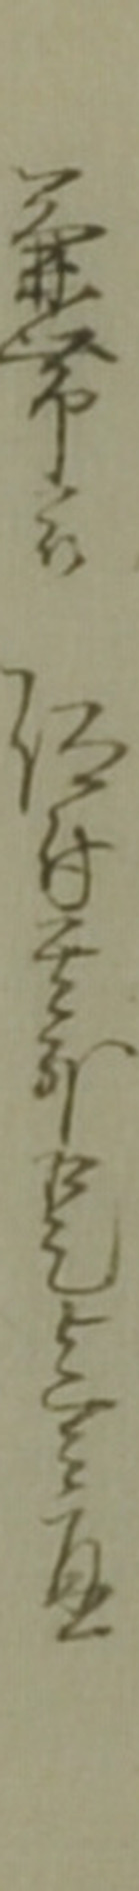兼帯被仰付其外是迄之通
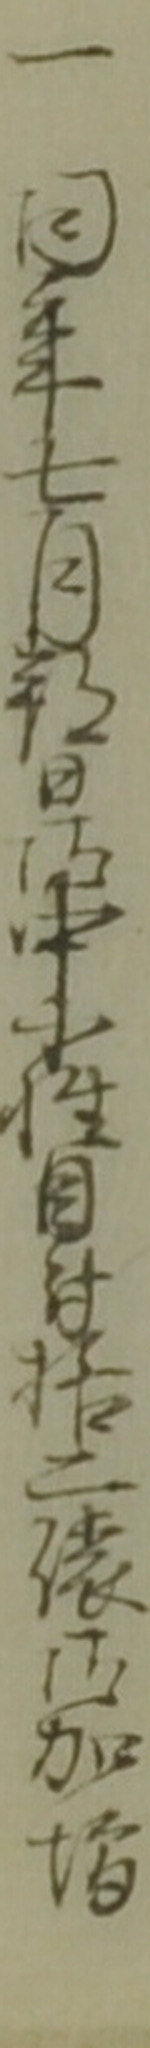一同年七月朔日御中小性目付格二俵御加増
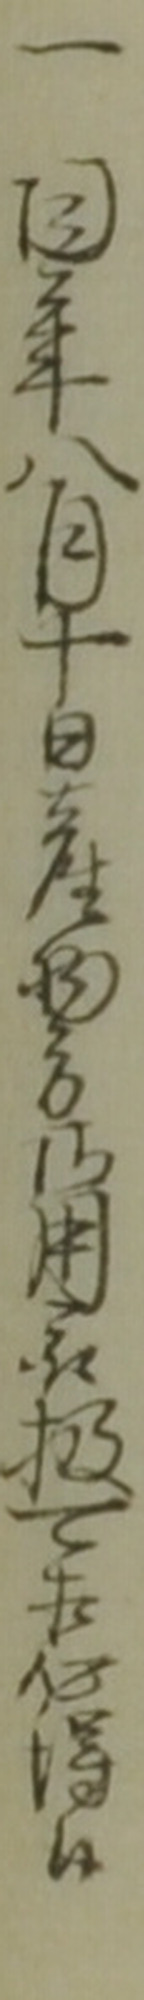一同年八月十日産物方御用取扱可相心得候
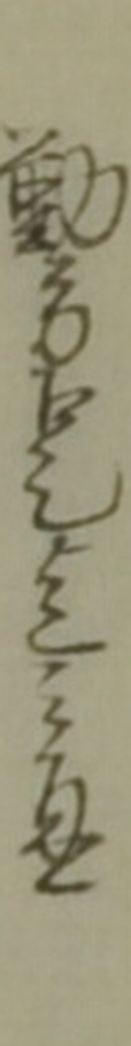勤方是迄之通
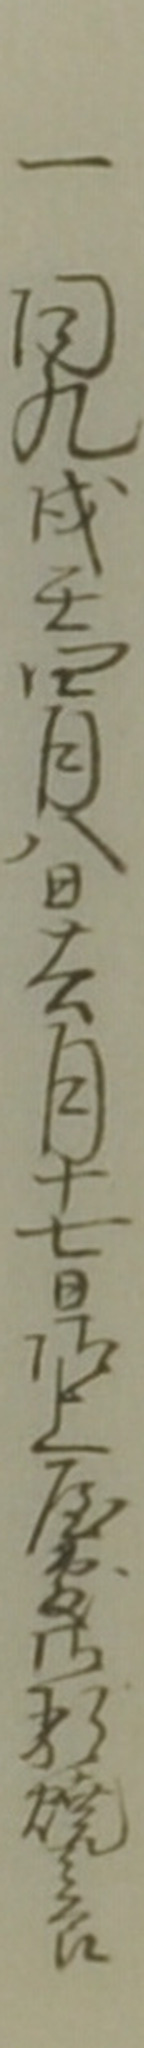一同九戌閏四月八日去月十七日御上屋敷御類焼之節
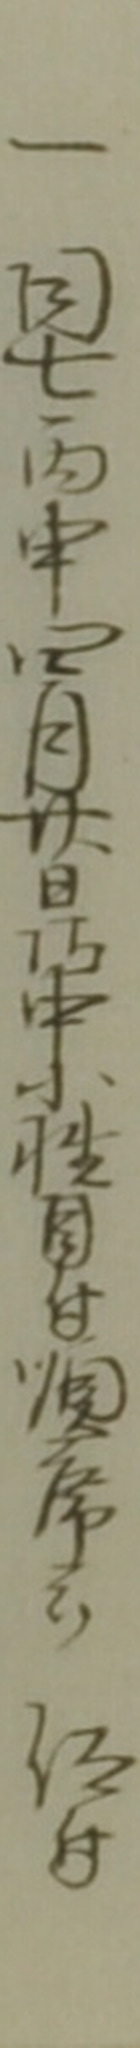一同七丙申四月廿日御中小性目付順席被仰付

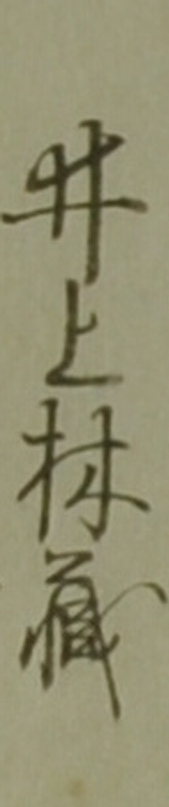井上林蔵

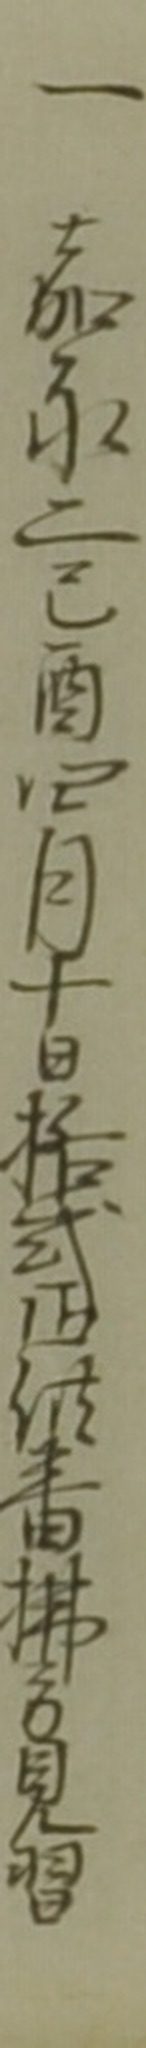一嘉永ニ己酉四月十日格式御供番払方見習
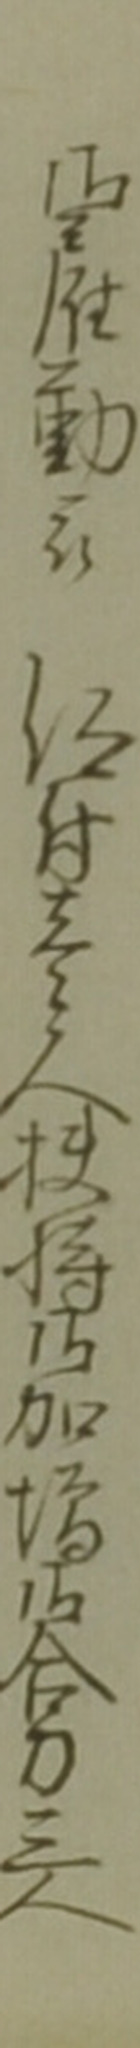御雇勤被仰付壱人扶持御加増御合力三人
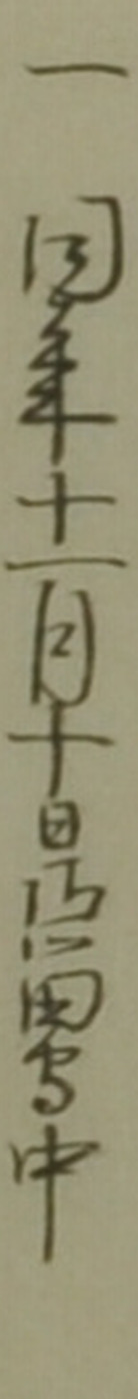一同年十一月十日御留守中
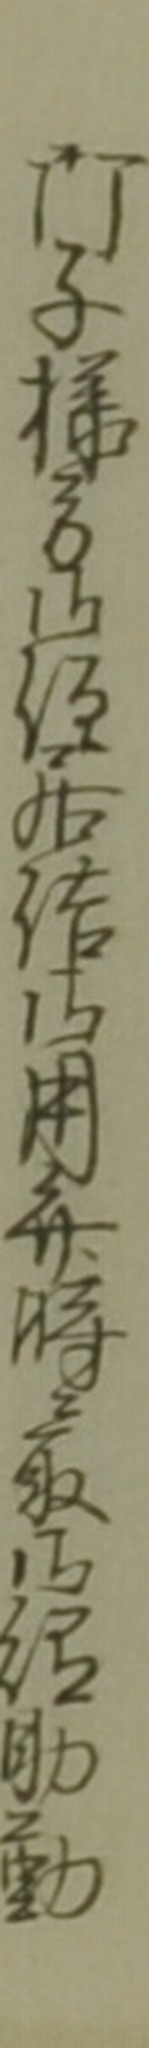御子様方住居詰御用弁時ニ取御賄助勤
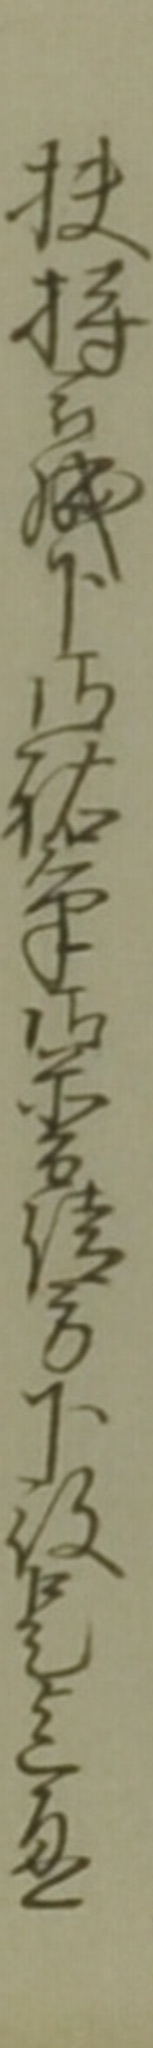扶持被成下御祐筆御普請方下役是迄通
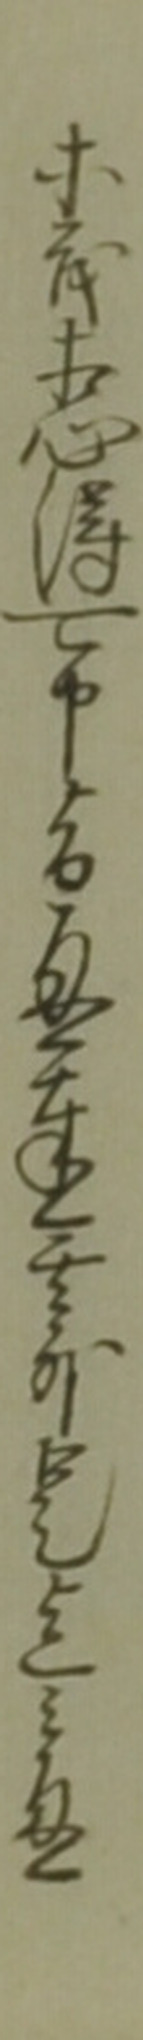等茂相心得可申旨通達其外是迄之通
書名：無足諸士勤仕録（一）
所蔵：伊那市立高遠町図書館・合同会社AMANE
